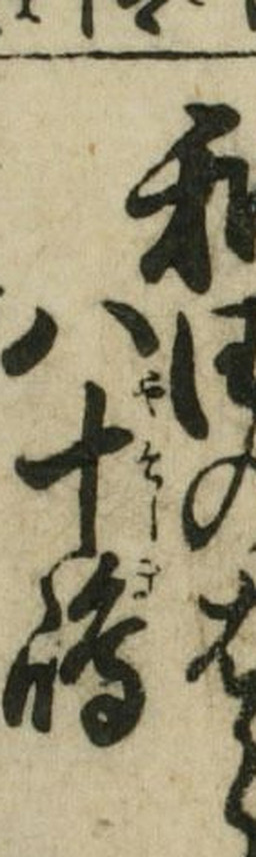八十島
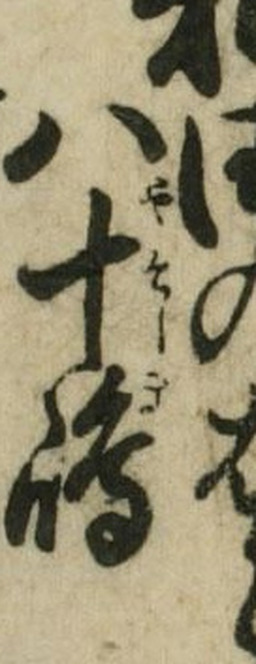八十島
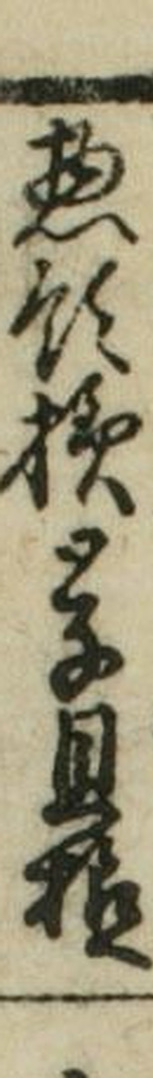惣領様御子息様
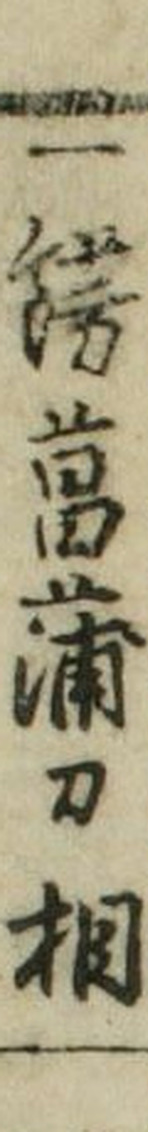一錺菖蒲刀相
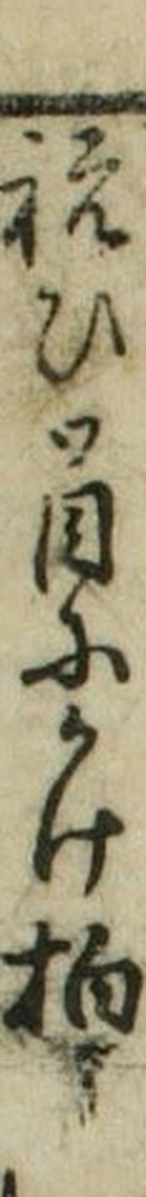祝ひ御目にかけ柏
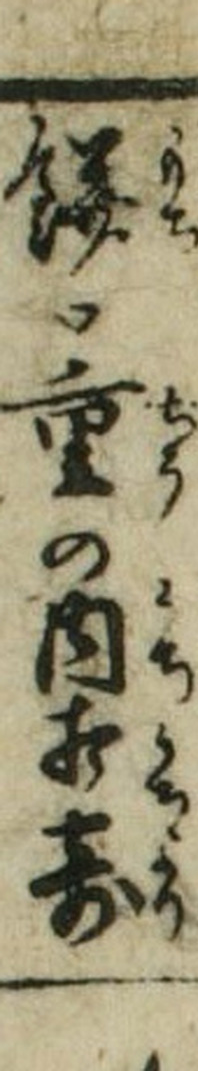餅御重の内打寄
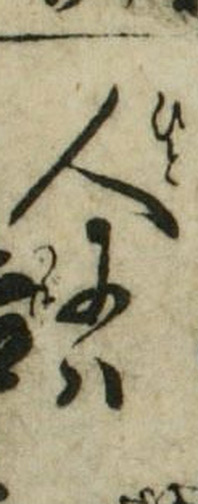人には
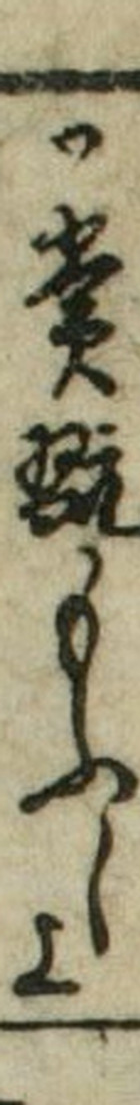御賞翫もふし上
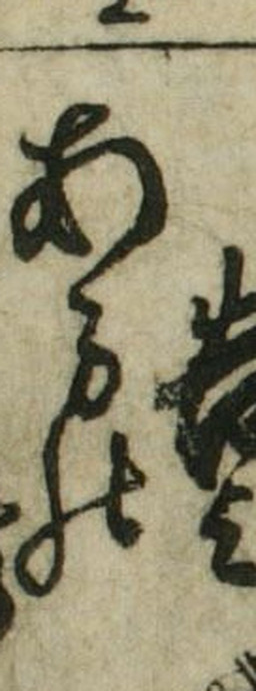あまの
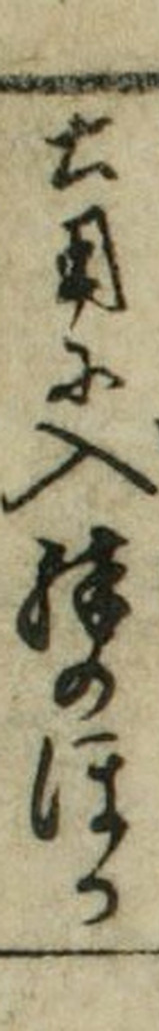土用に入殊のほか
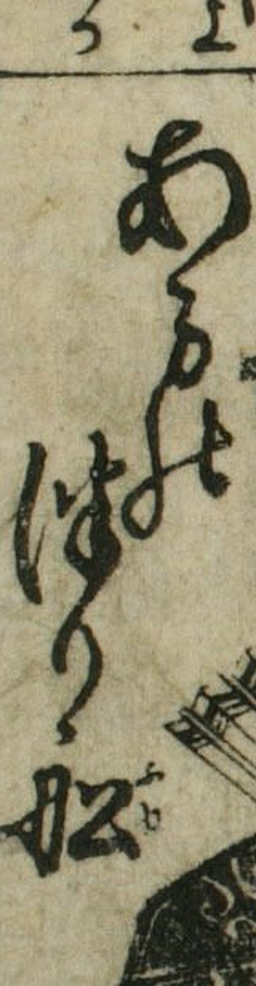つり船
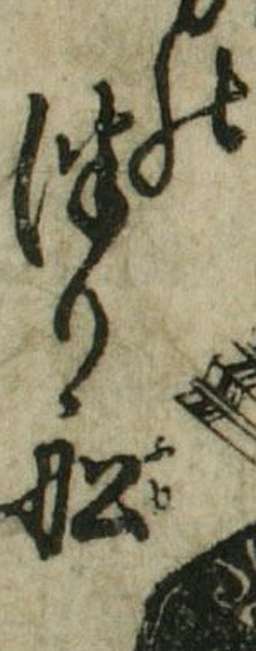つり船

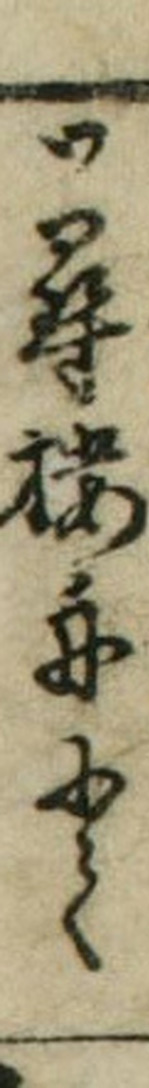御尋楼舟にて
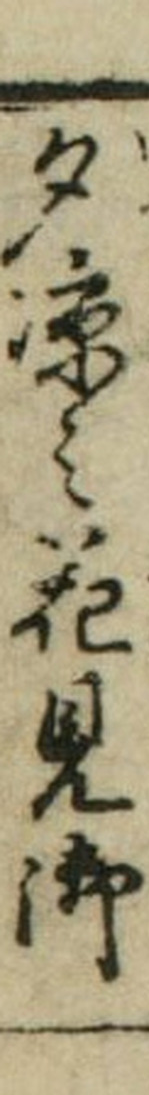夕涼み花見御
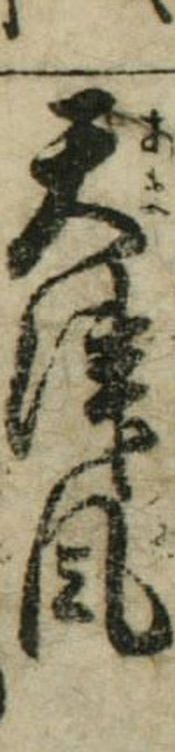天津風
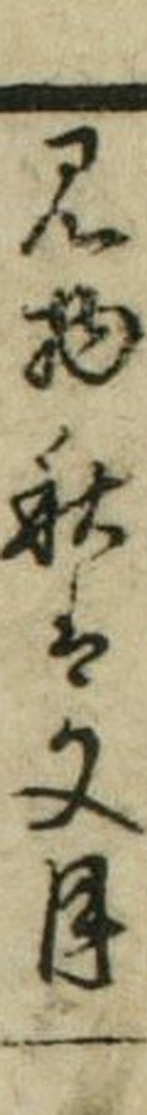見物秋は文月
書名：百人一首
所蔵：東京学芸大学教育コンテンツアーカイブ
